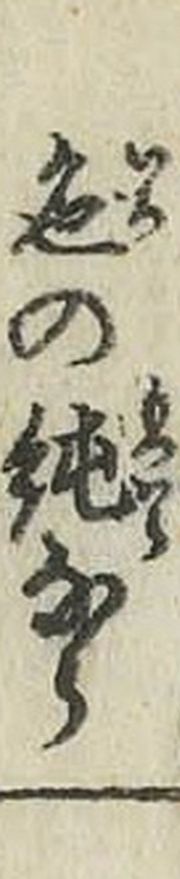色の純なら
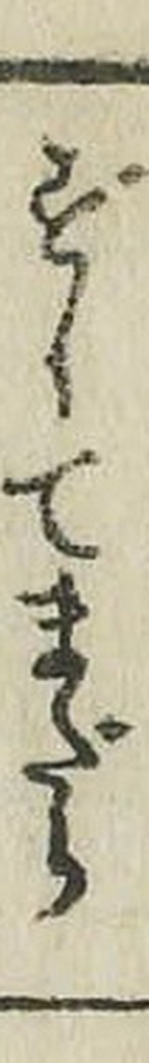ずしてまだら
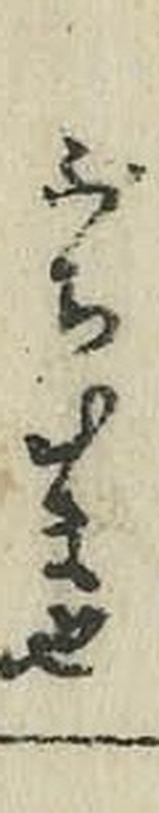ぶちむま也

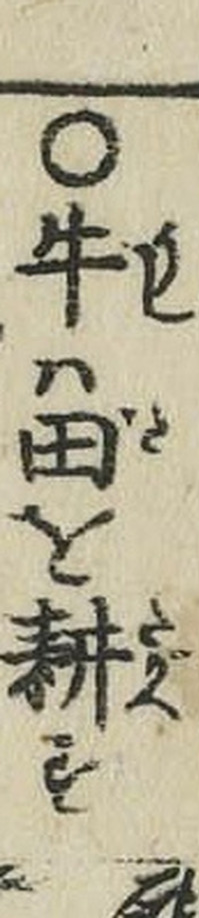○牛は田を耕す
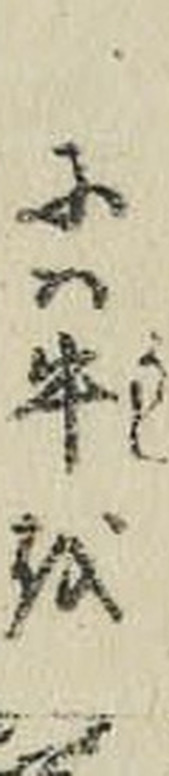には牛を
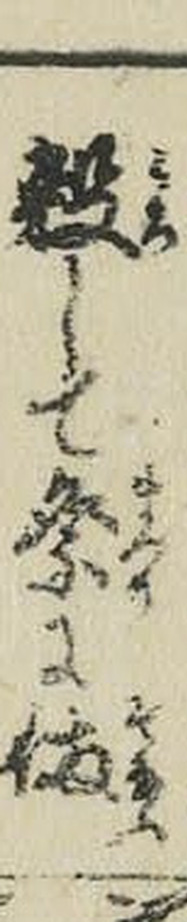殺して祭に備
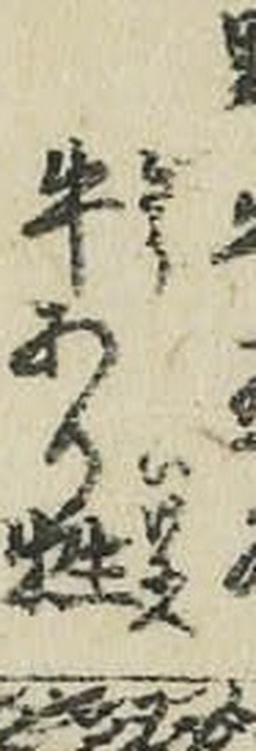牛あり牲
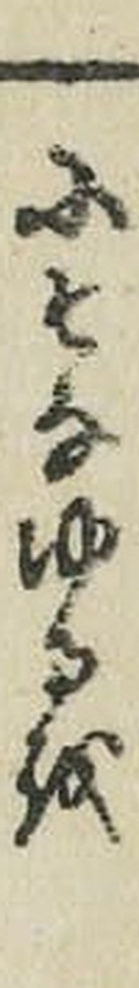にそなゆるを
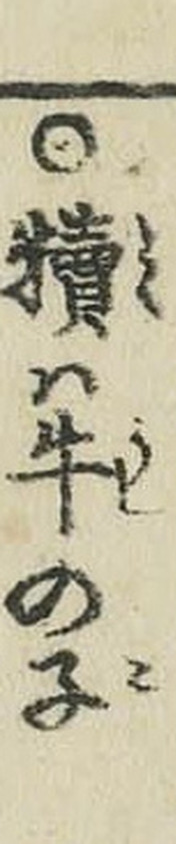○犢は牛の子
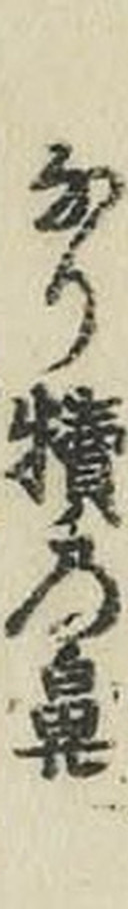なり犢の鼻
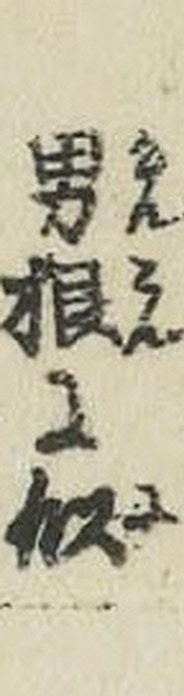男根に似
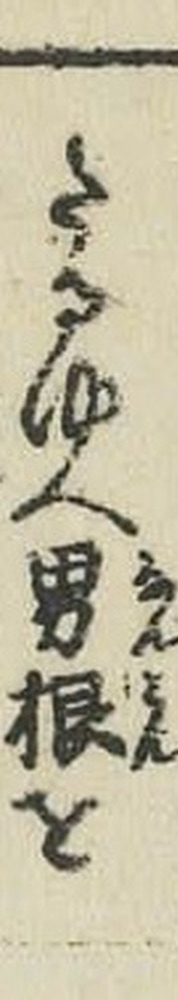たるゆへ男根を
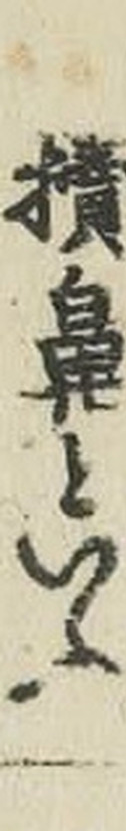犢鼻といふ
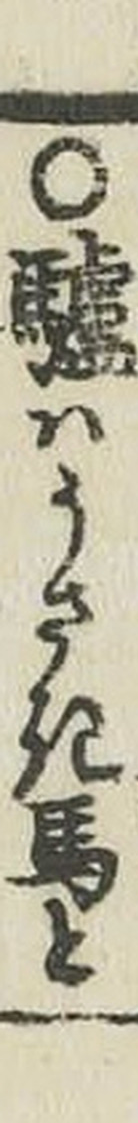○驢はうさき馬と
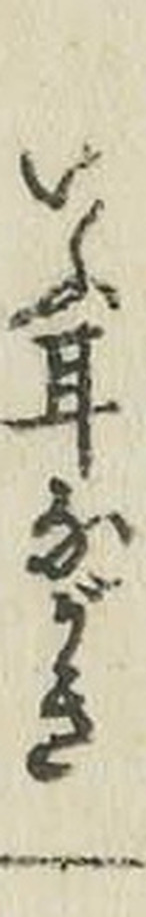いふ耳ながき
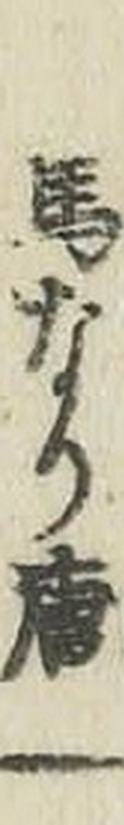馬なり唐
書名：増補頭書訓蒙図彙大成 10巻 6:巻之12-13
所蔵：東京学芸大学教育コンテンツアーカイブ
